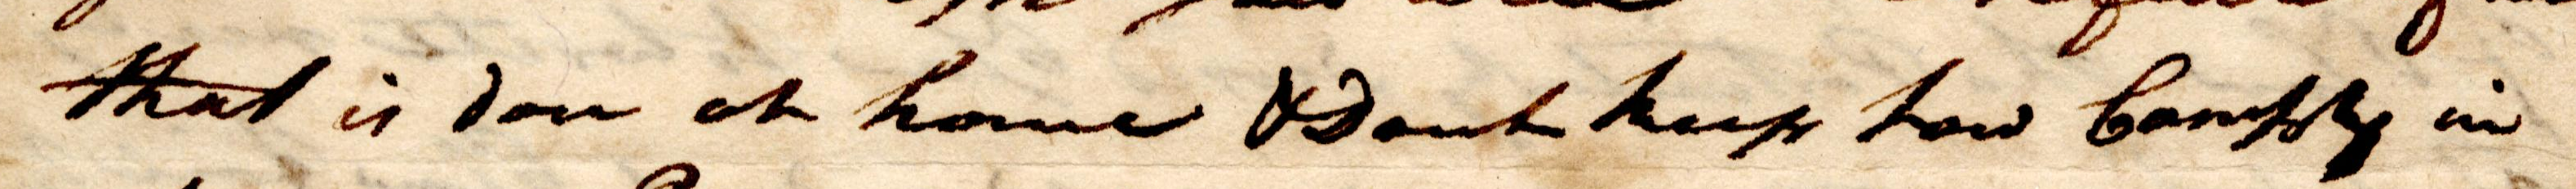that is don at home & dont keep how Compy in
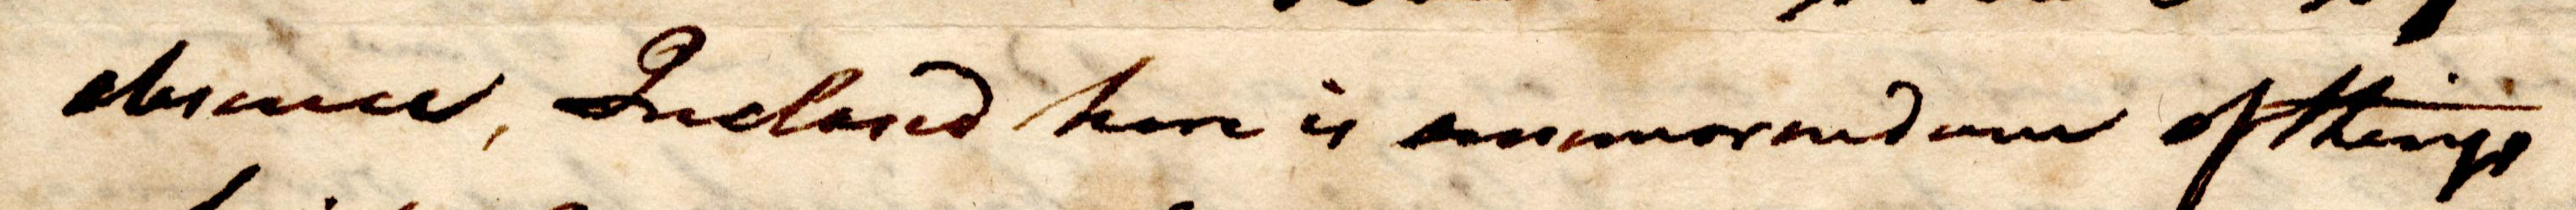absence, Inclosed here is a memorandum of things
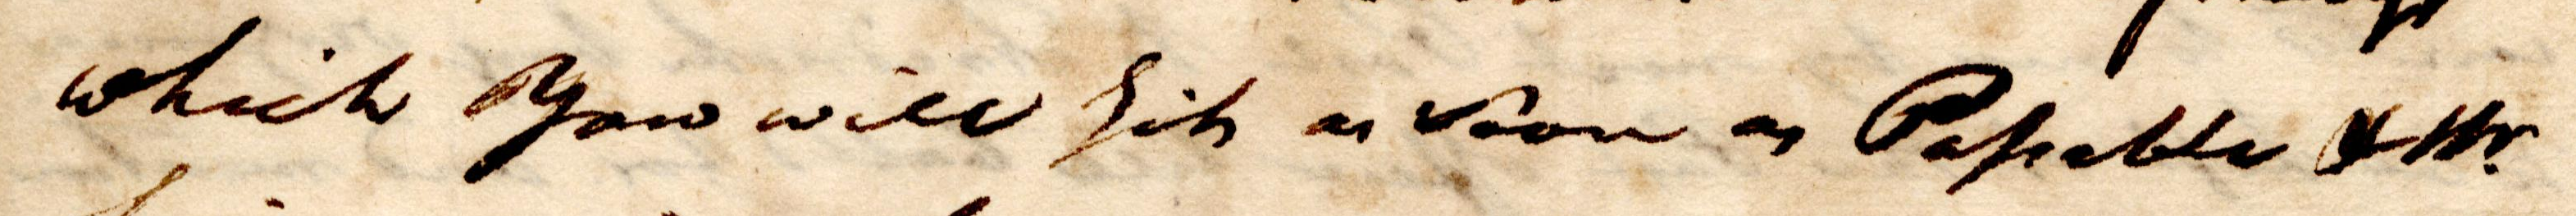which you will Git as soon as Possable & M^r
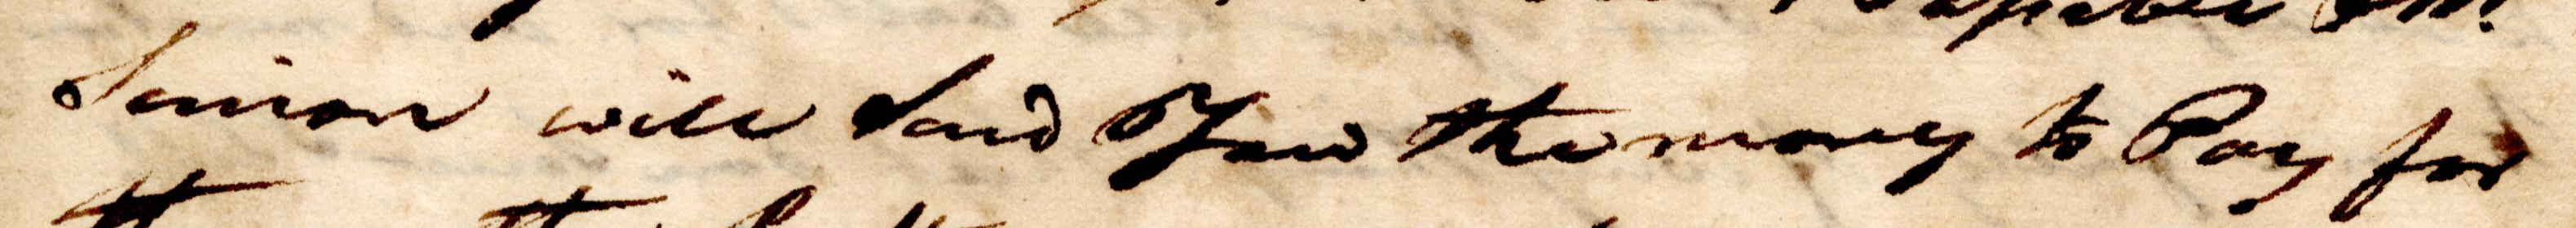Simon will send you the money to Pay for
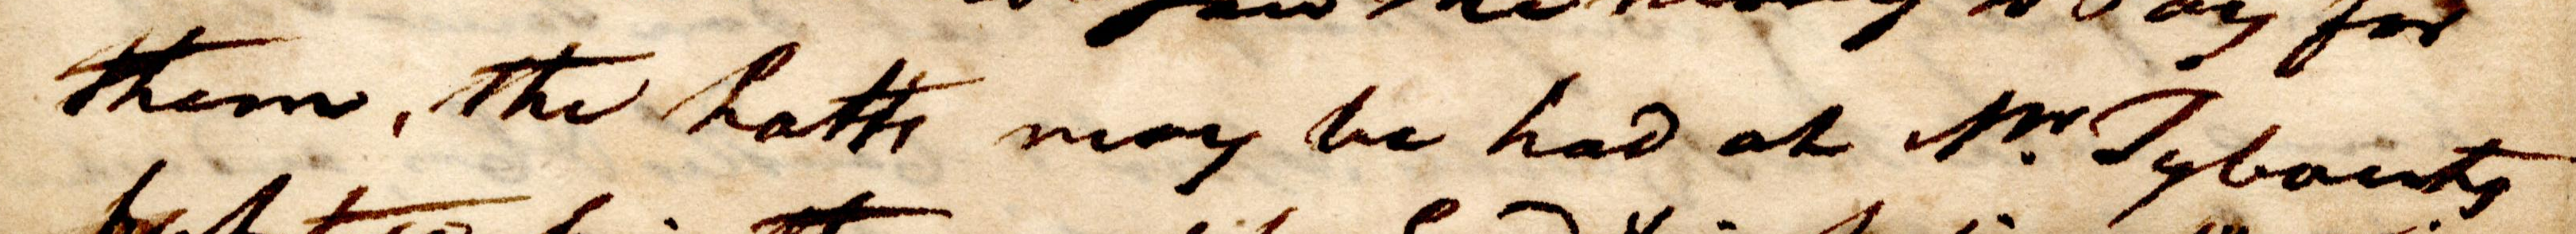them, the hatts may be had at M^r Tybants
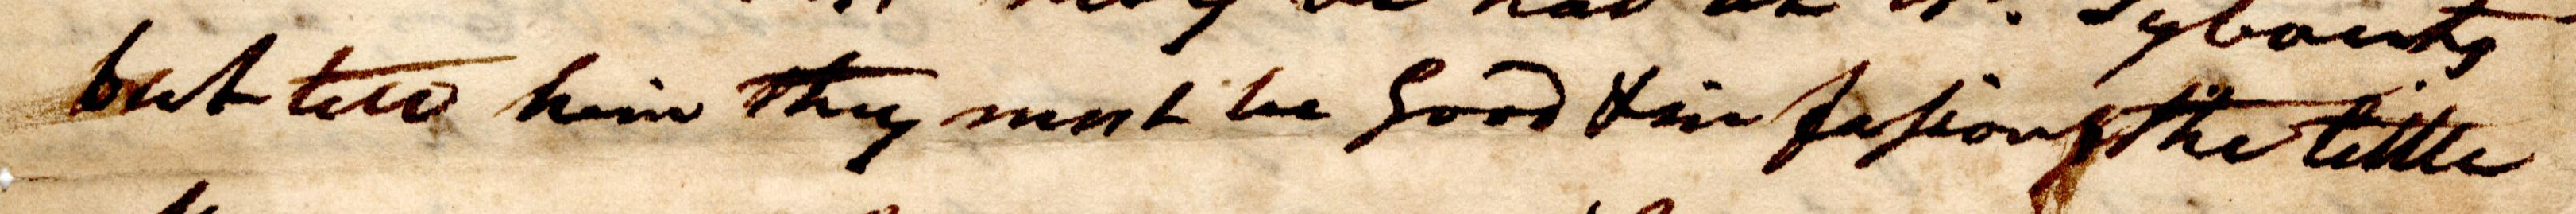but tell him they must be good & is fasion the title
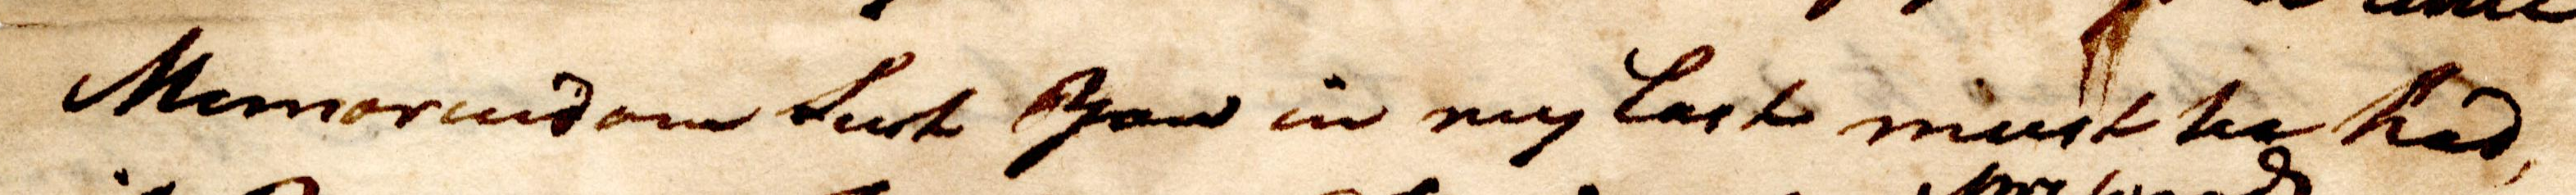Memorandum sent you in my last must be had,
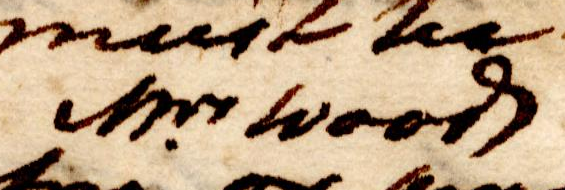M^rs woods
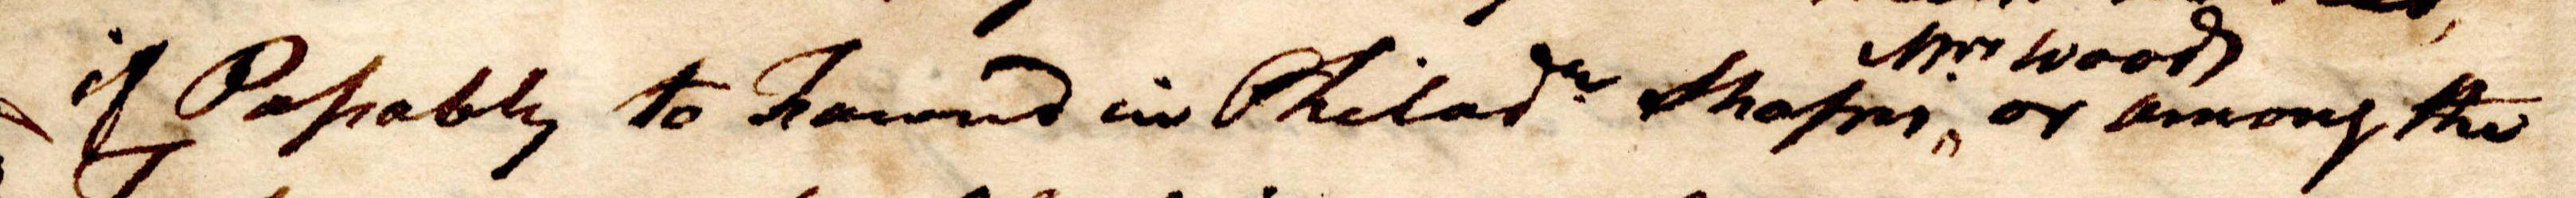if Possably to Found in Philad^a. Sharps, or among the
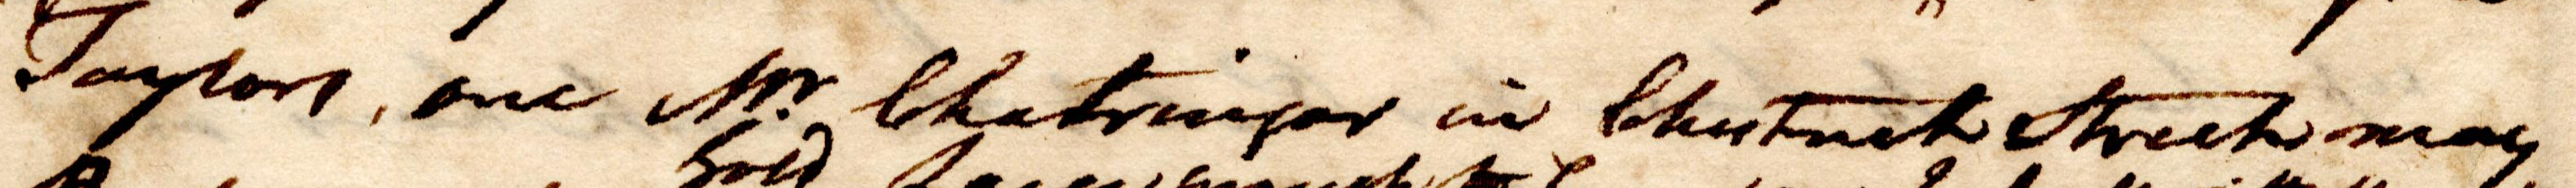Taylors, one M^r Chatringer is Chestnut Street, may
